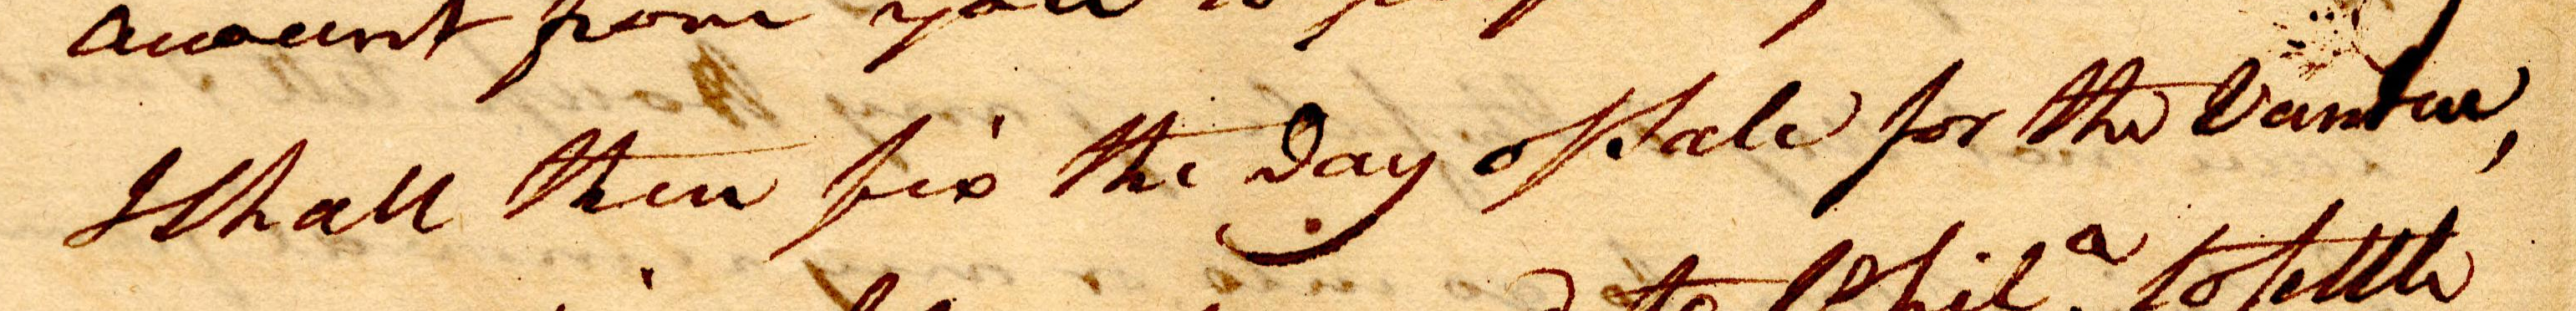I shall then fix the Day of sale for the vandue,
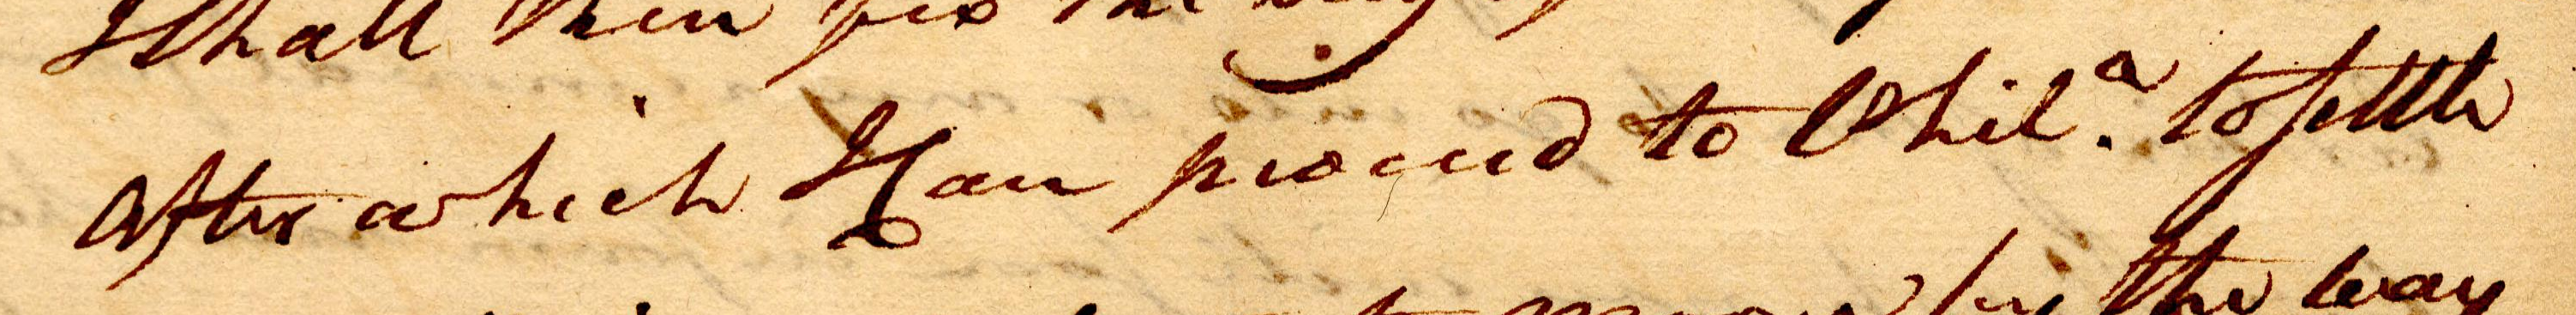After which I can proceed to Phil^a to settle
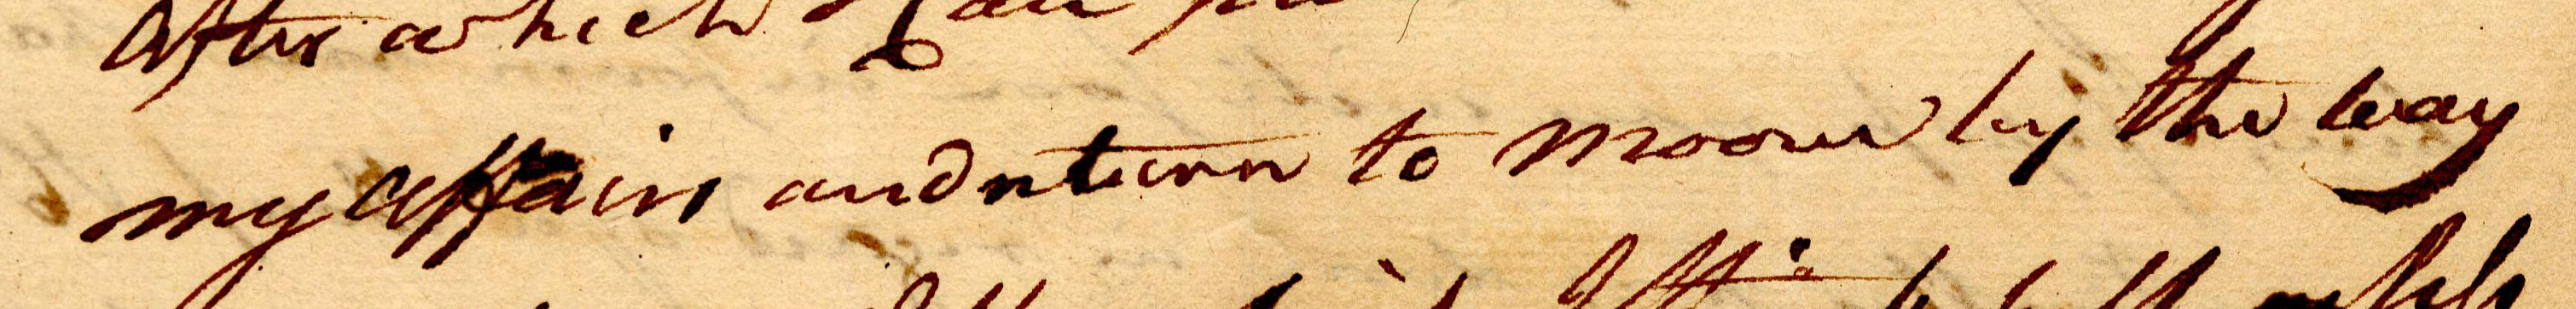my affairs and turn to moove by the way
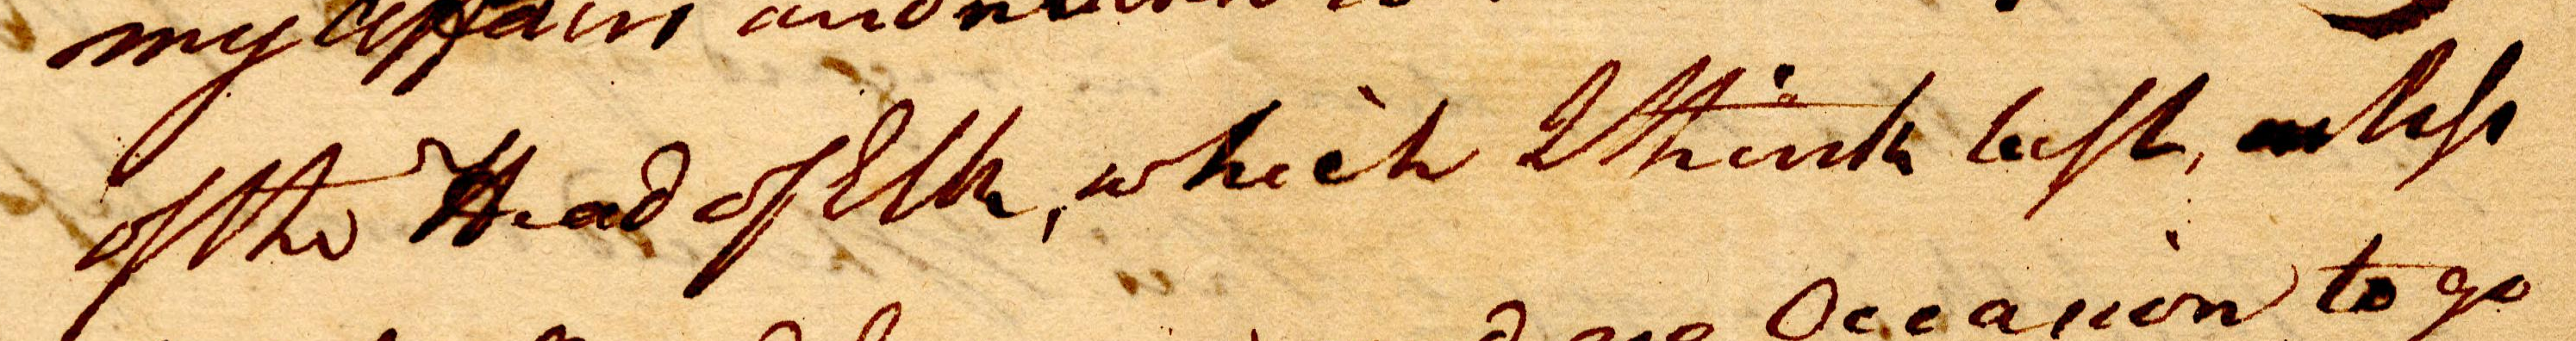of the Head of Elk, which I think best, less
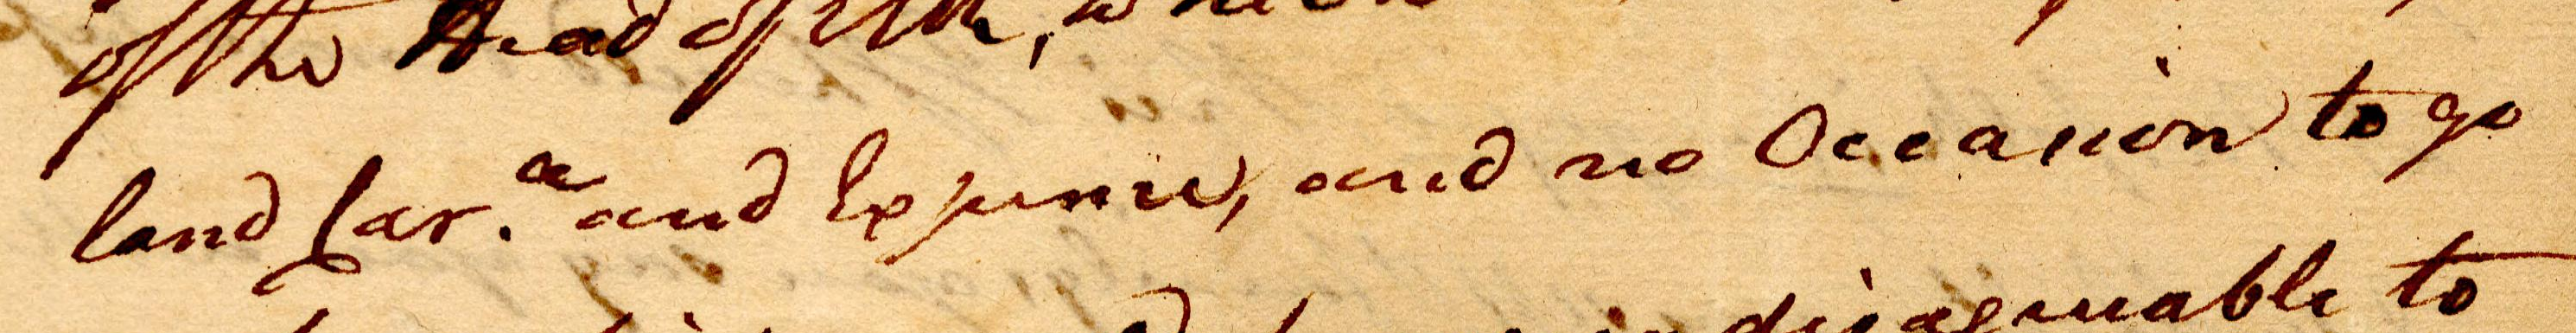land Car^ae. and Expense, and no Occasion to go
